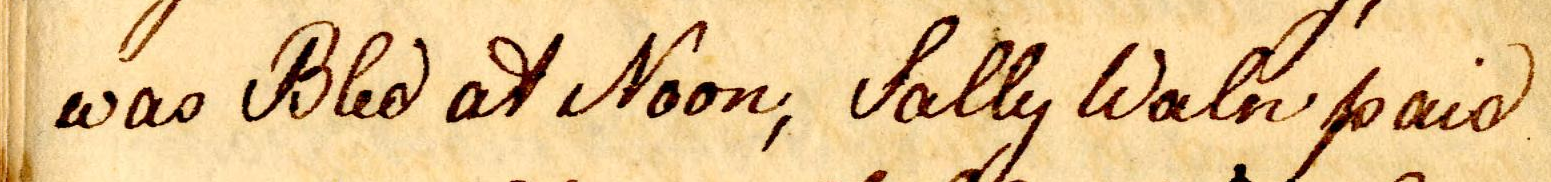was Bled at Noon, Sally Waln paid
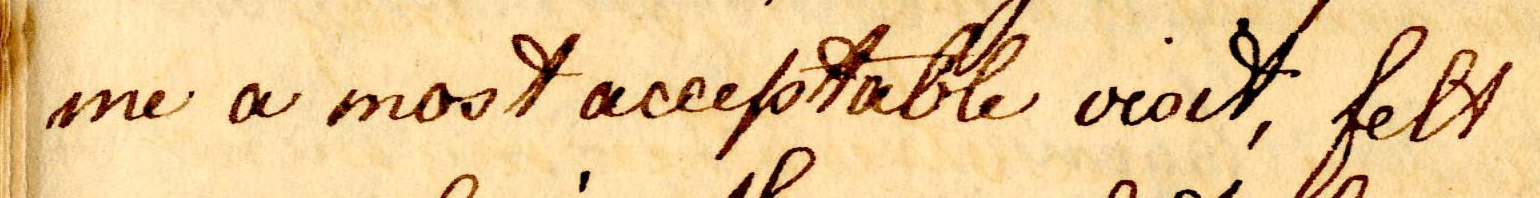me a most acceptable visit, felt
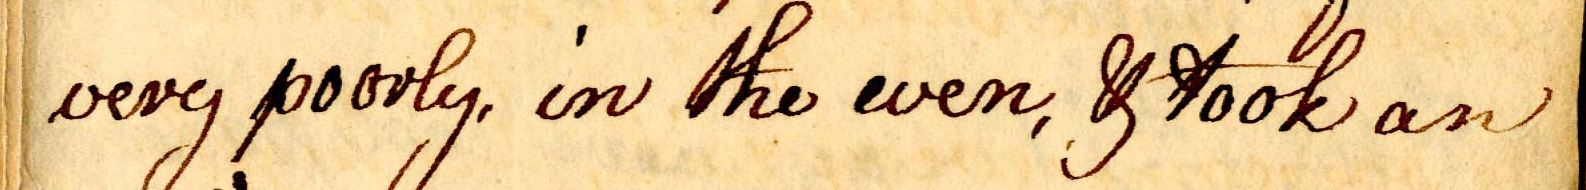very poorly, in the even, & took an
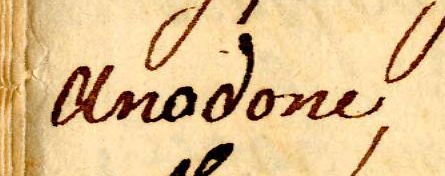Anodone
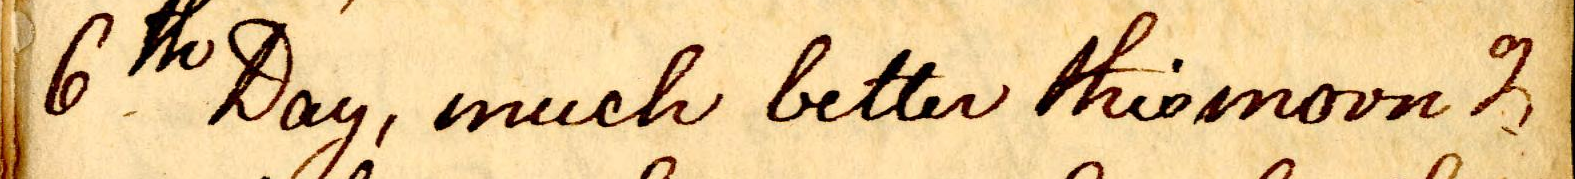6^th Day, much better this morn^g
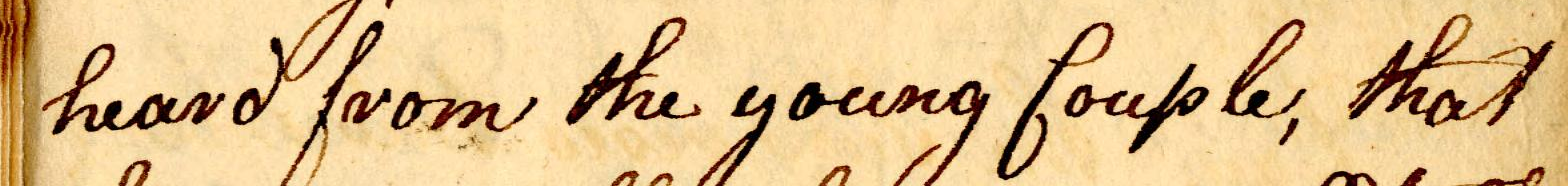heard from the young Couple, that
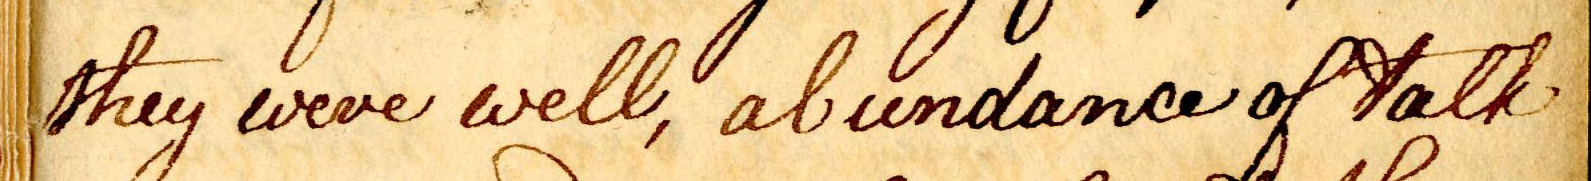they were well, abundance of talk
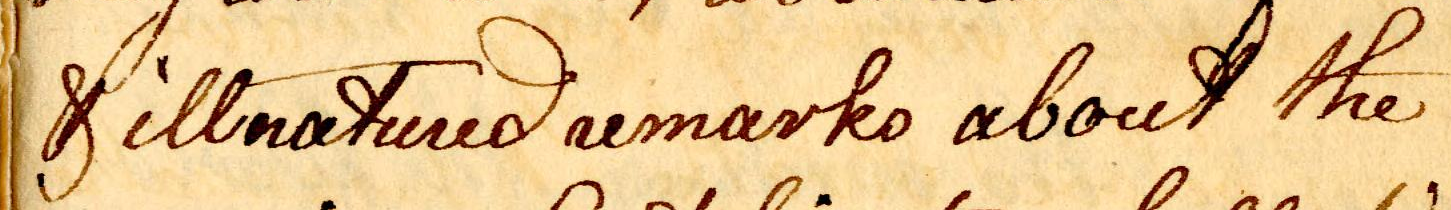& illnatured remarks about the
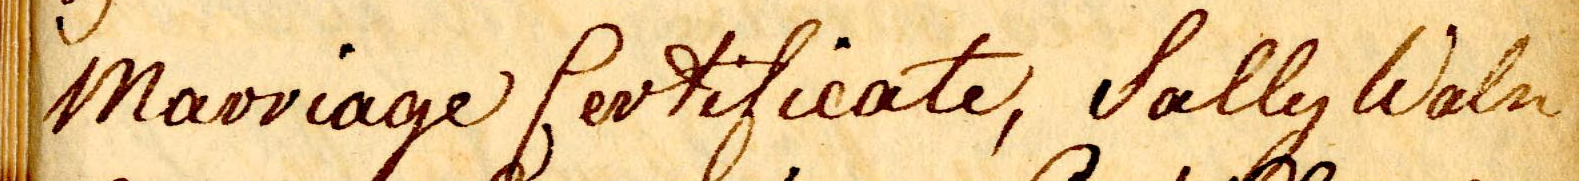Marriage Certificate, Sally Waln
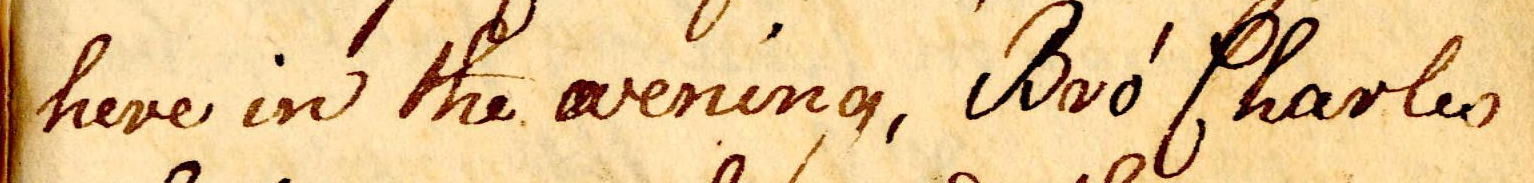here in the evening, Bro' Charles
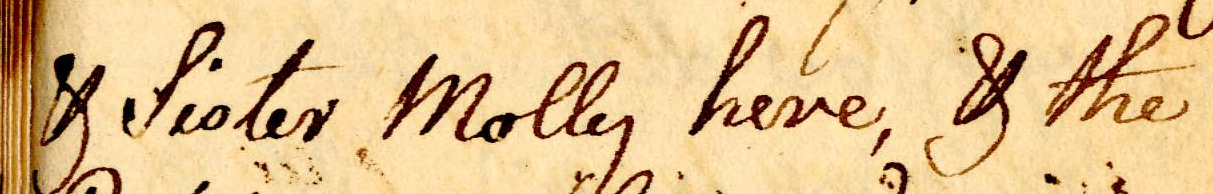& Sister Molly here, & the
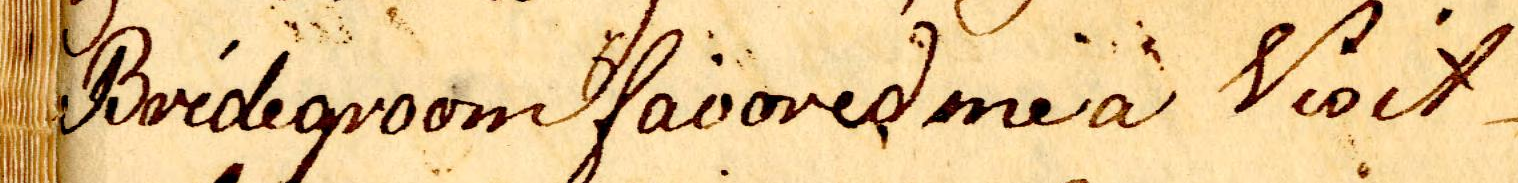Bridegroom favored me a Visit
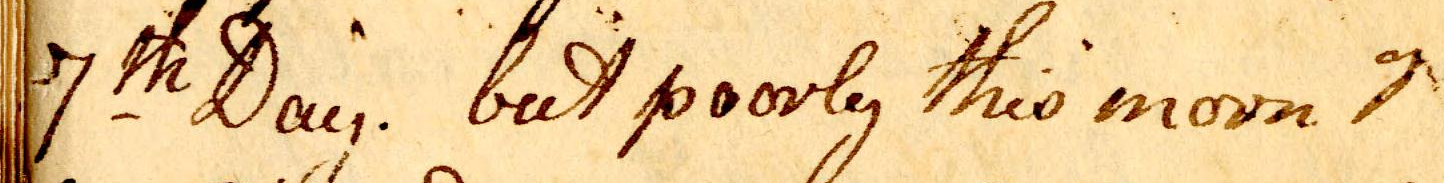7^th Day. but poorly this morn^g
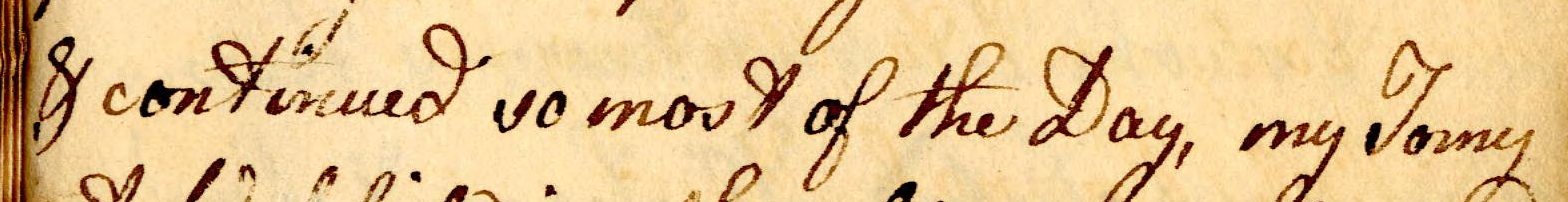& continued so most of the Day, my Tomy
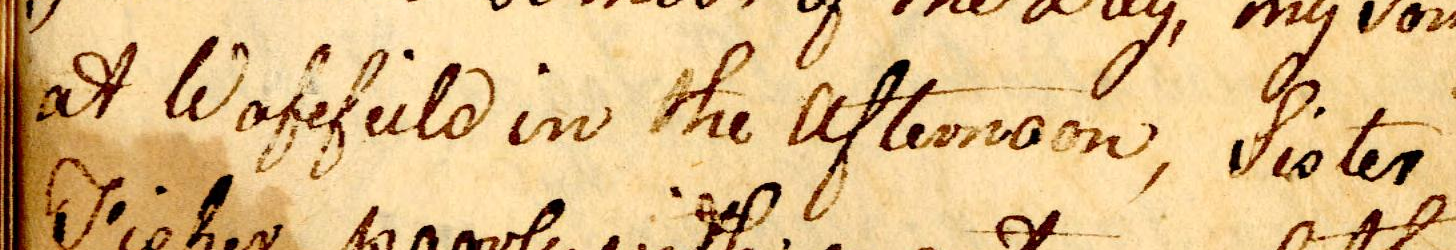at Wafefeild in the Afternoon, Sister
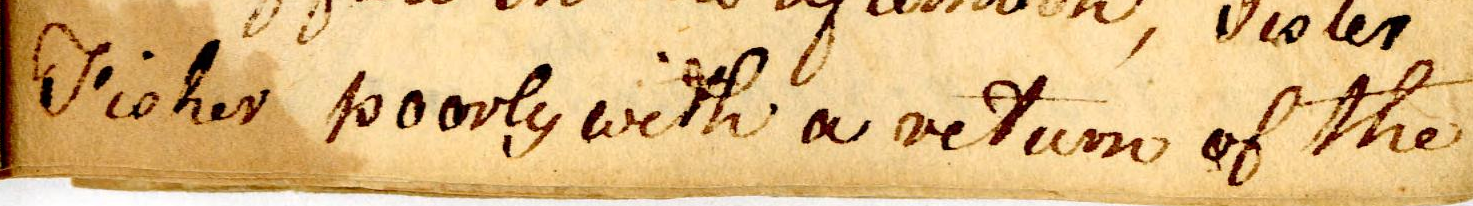Fisher poorly with a return of the
